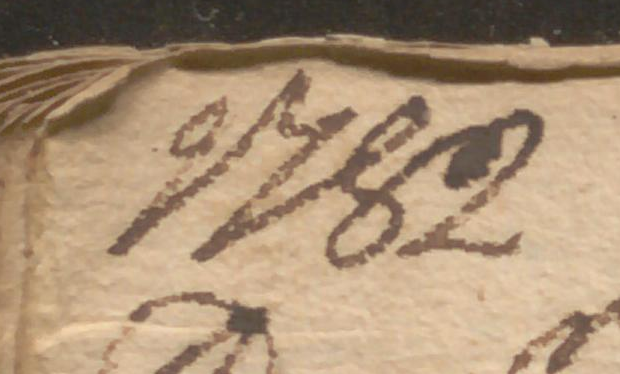1782
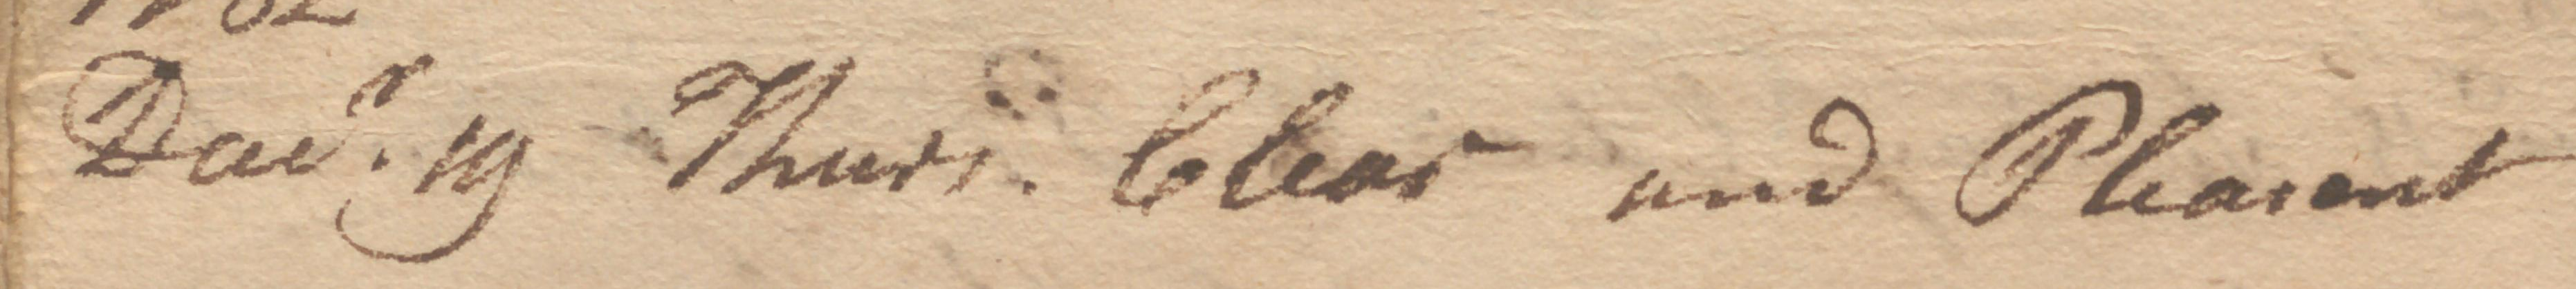Dec^r. 19 Thurs. Clear and Pleasent
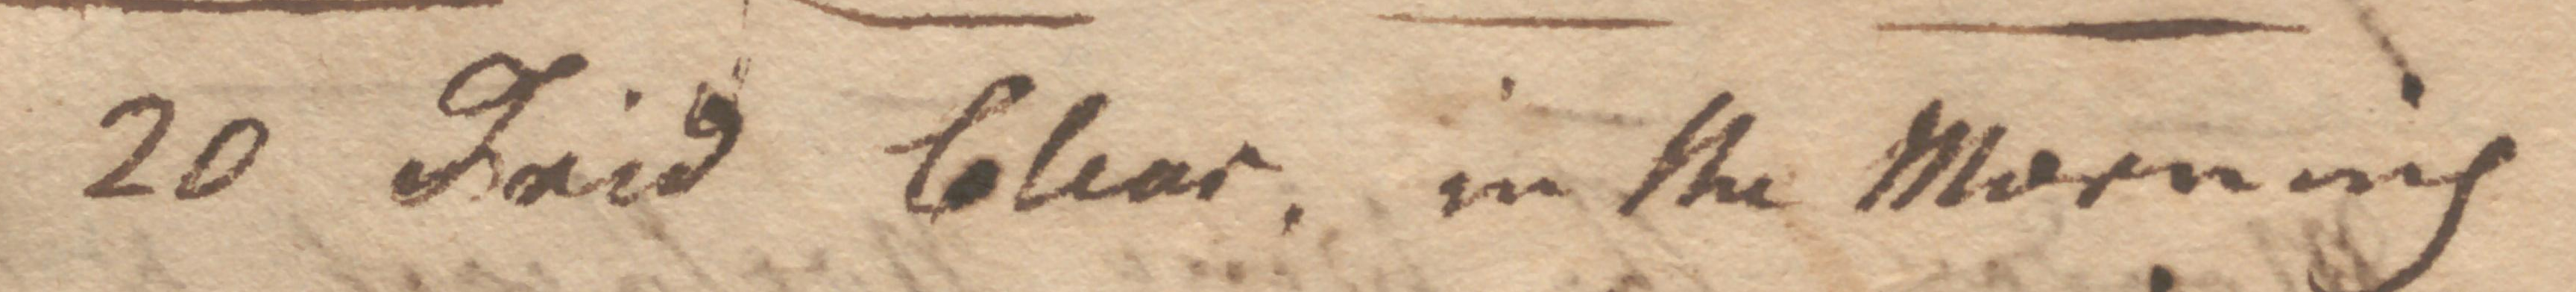20 Frid Clear, in the Morning
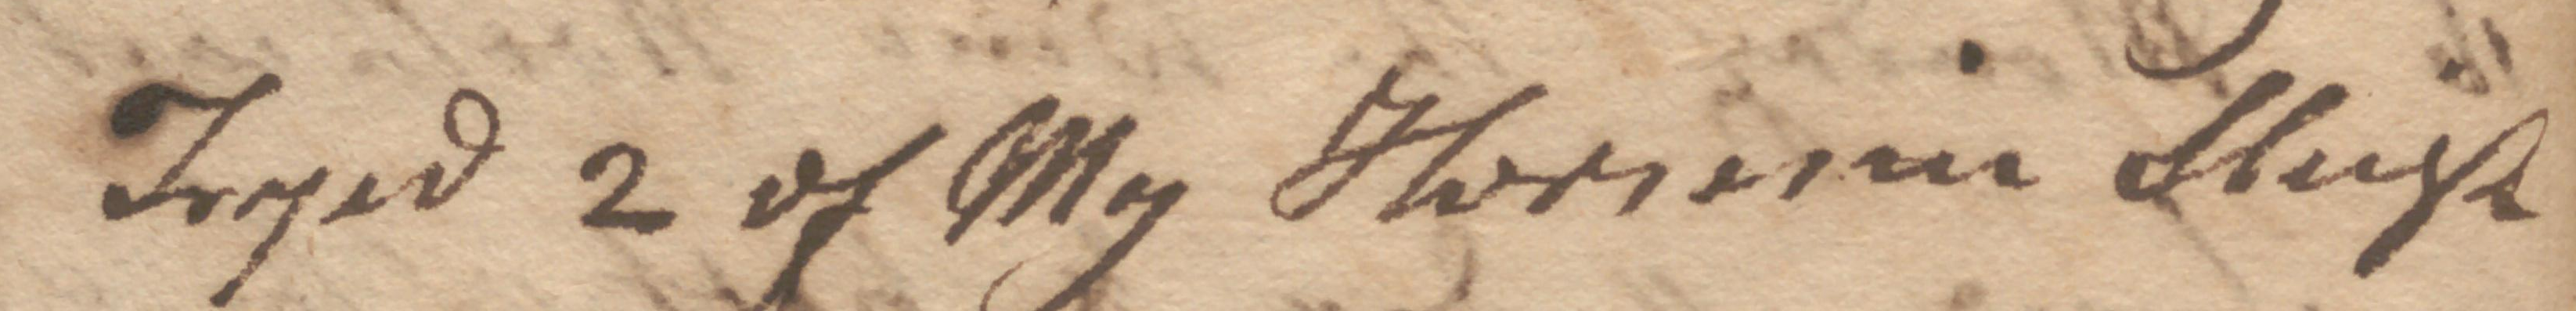Tryed 2 of My Horses in Sleigh
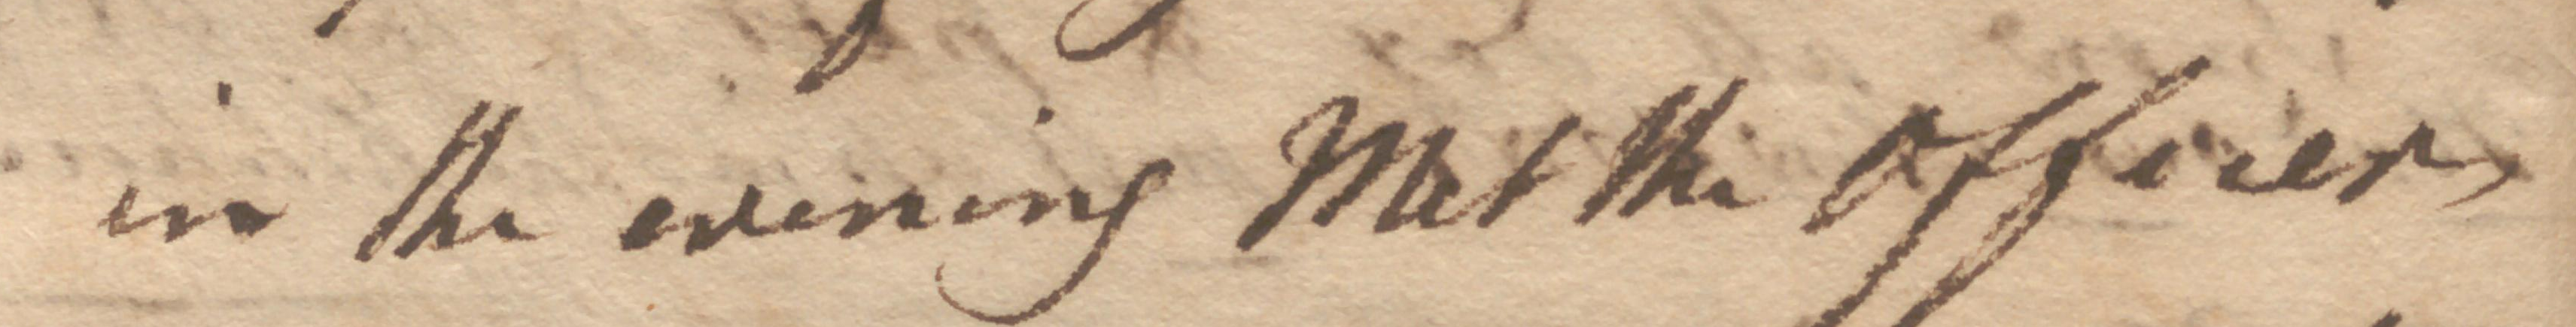in the evening Met the officers
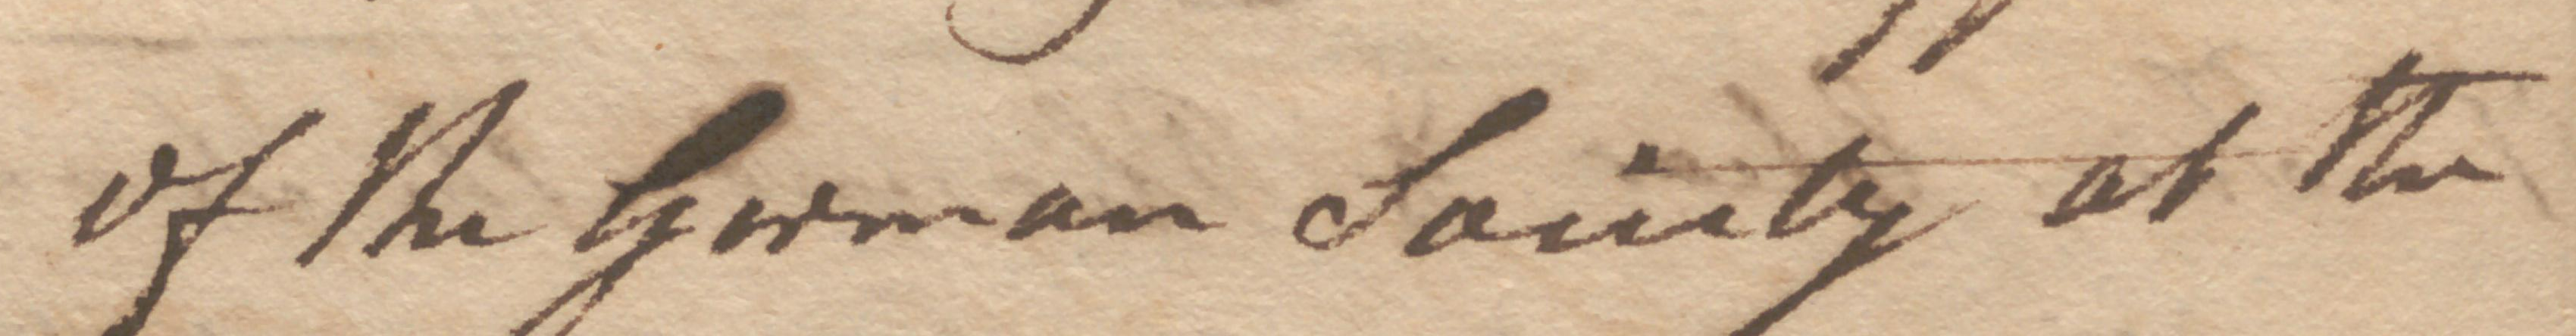of the German Society at the
